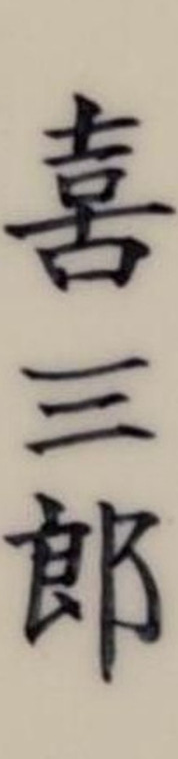喜三郎
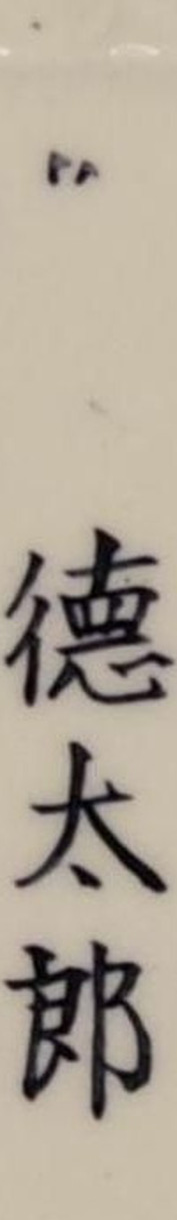徳太郎
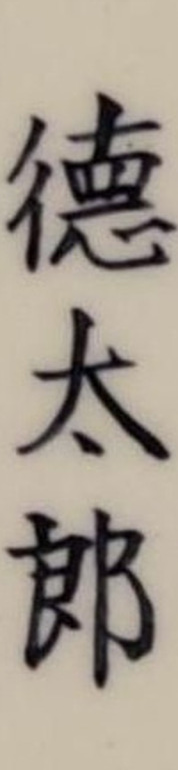徳太郎
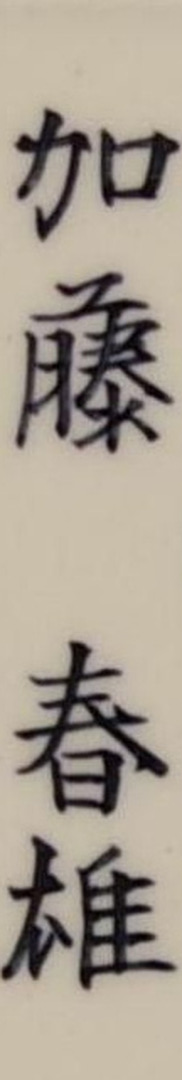加藤春雄
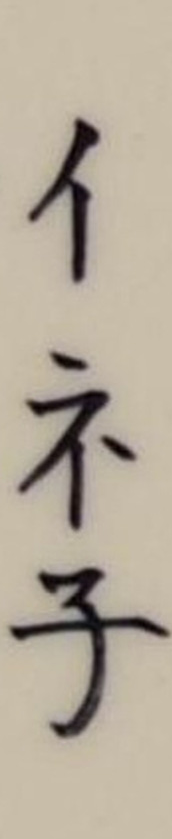イネ子
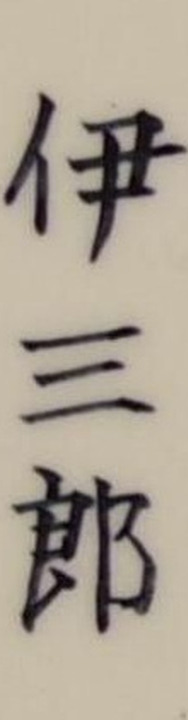伊三郎
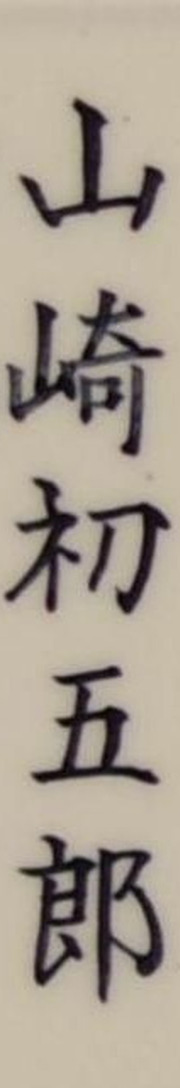山崎初五郎
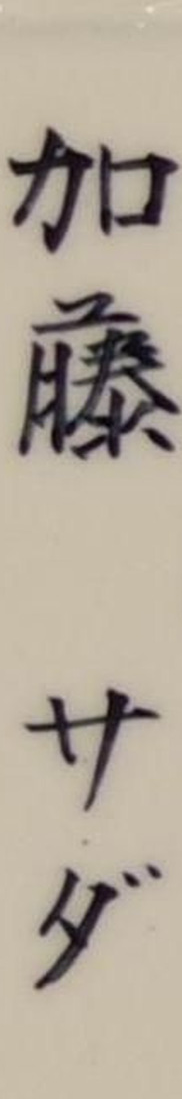加藤サダ
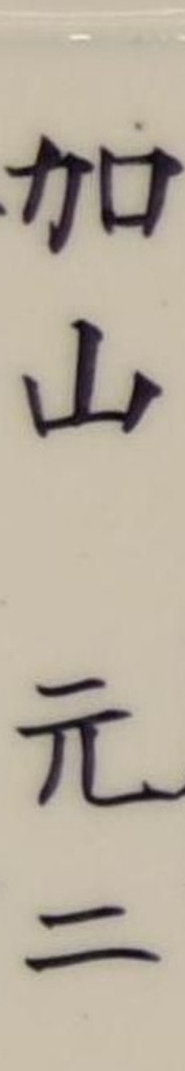加山元二

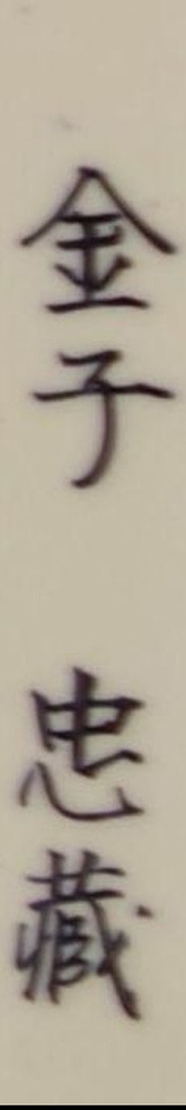金子忠蔵
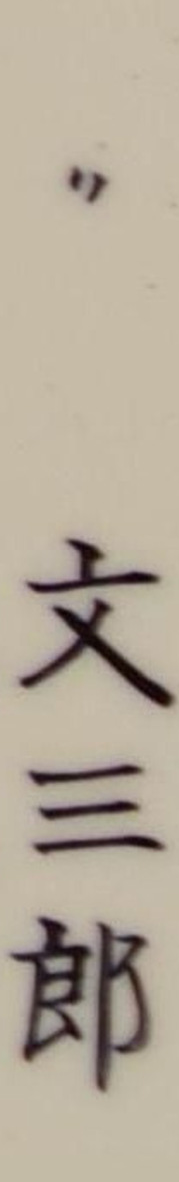文三郎
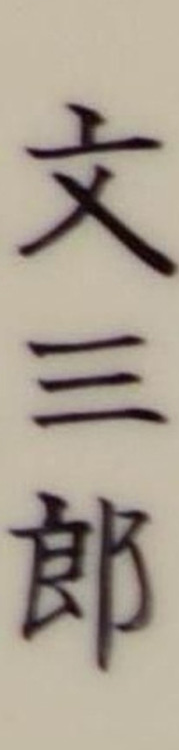文三郎
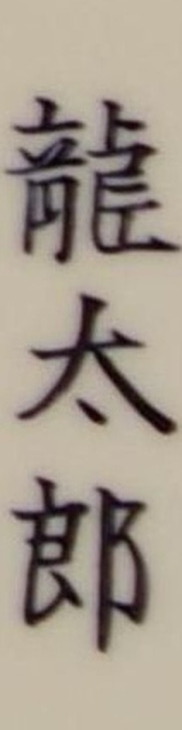龍太郎
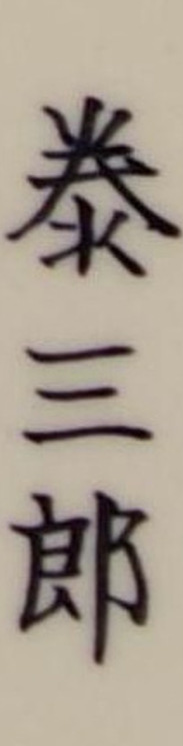泰三郎
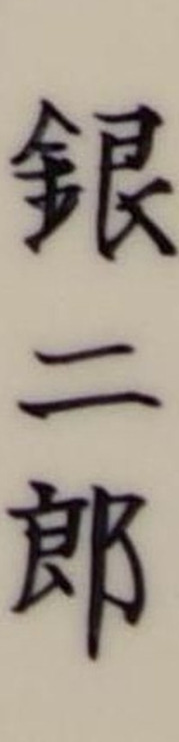銀二郎
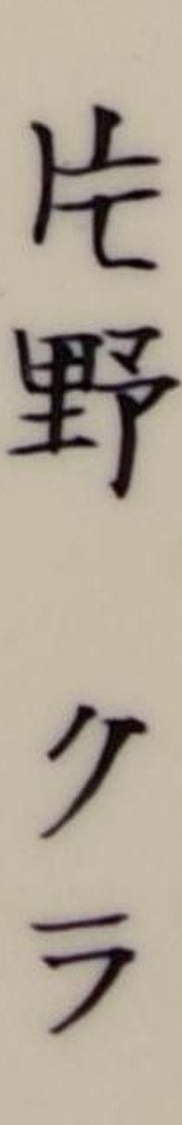片野クラ
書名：E~L
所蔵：高野山金剛峯寺
